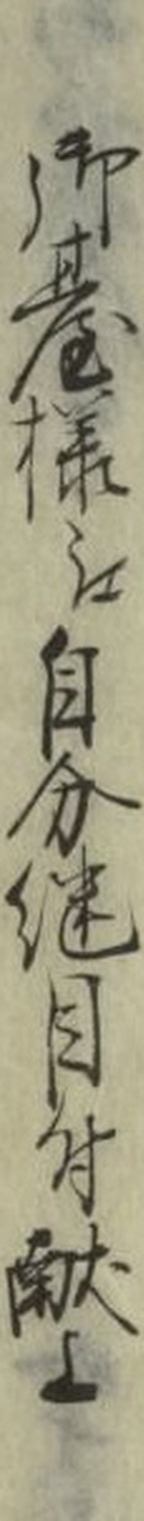御台様え自分継目付献上
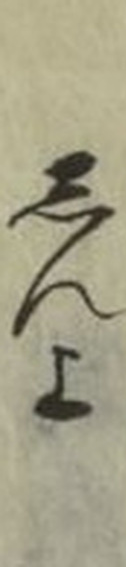しん上
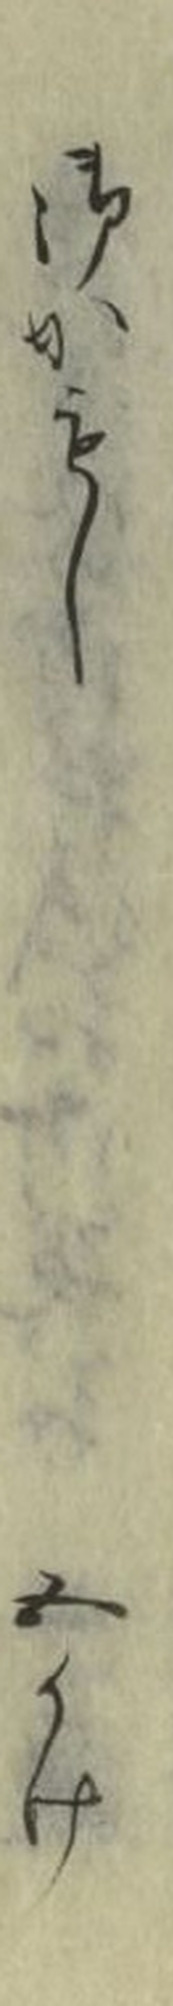御かもし五かけ
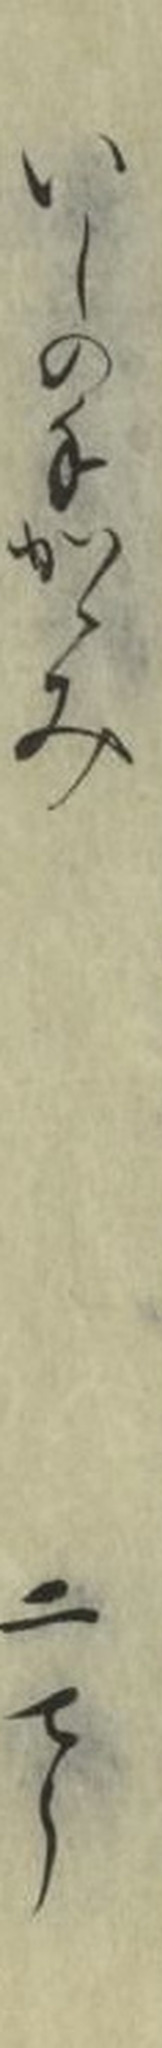いしの手かゝみ二てう
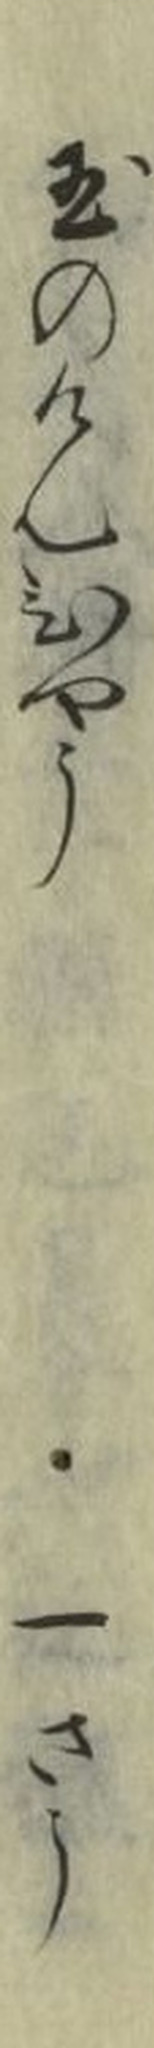玉のけんひやう一さう
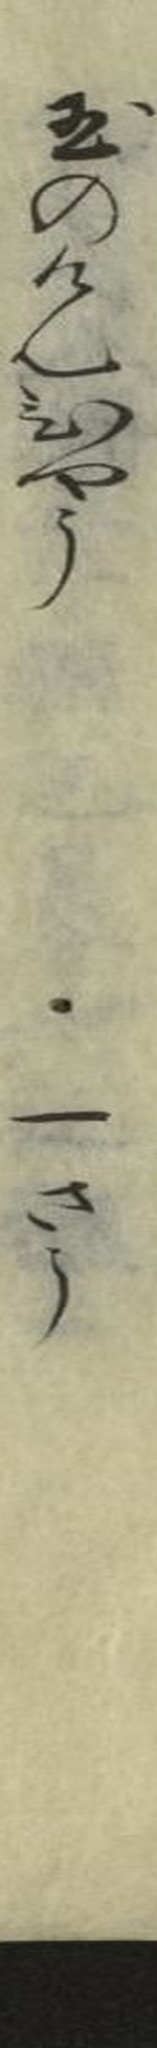玉のけんひやう一さう
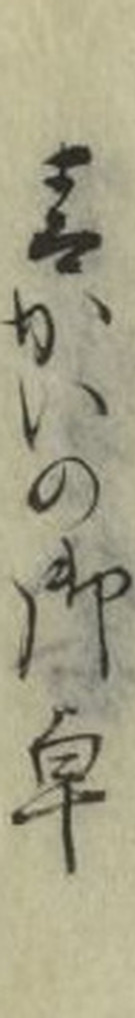青かいの御卓一脚
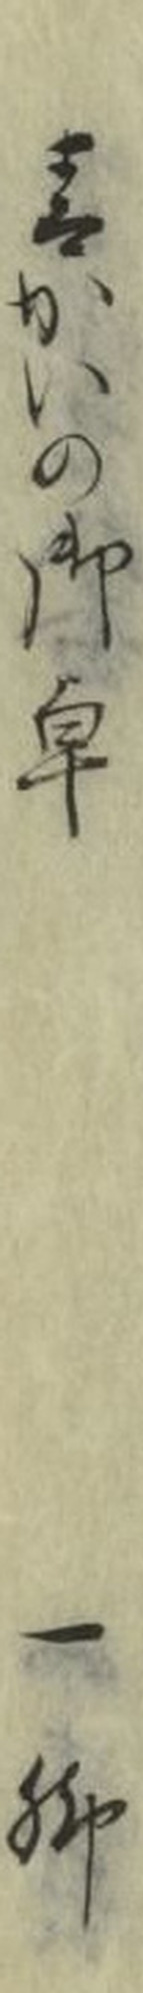青かいの御卓一脚
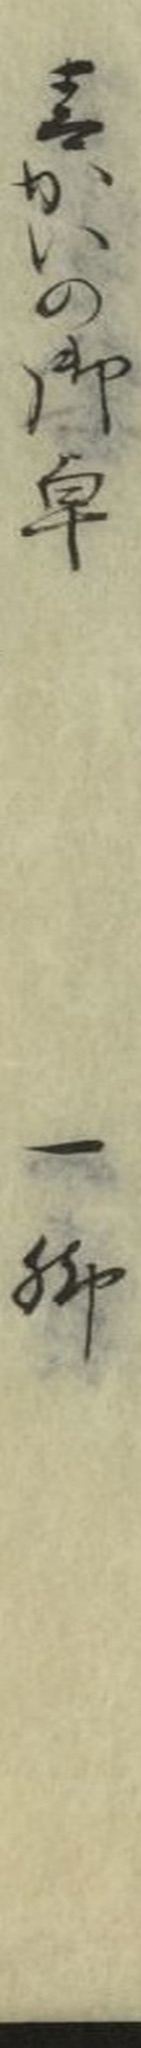青かいの御卓一脚
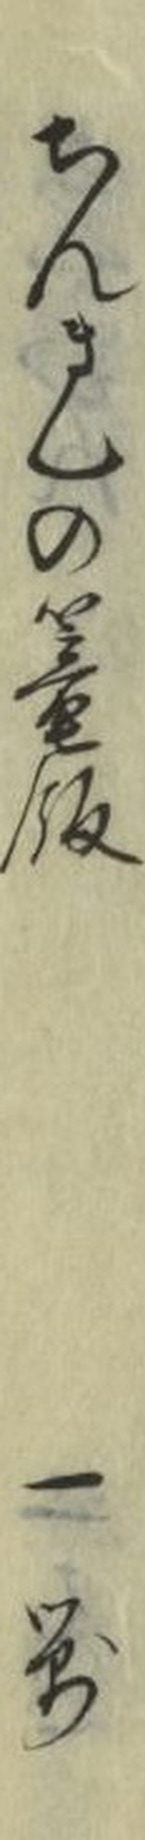ちんきんの篭飯一対
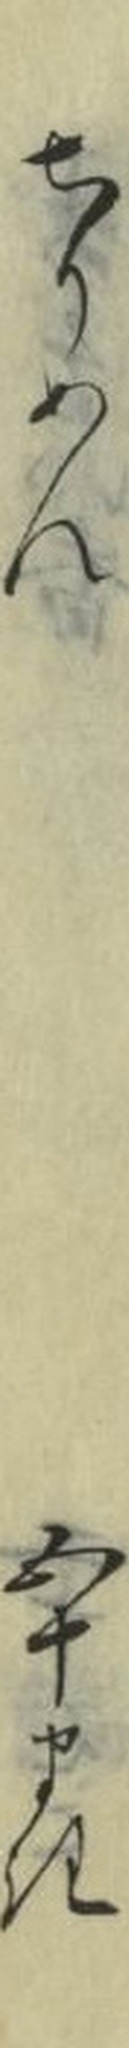ちりめん五十まき
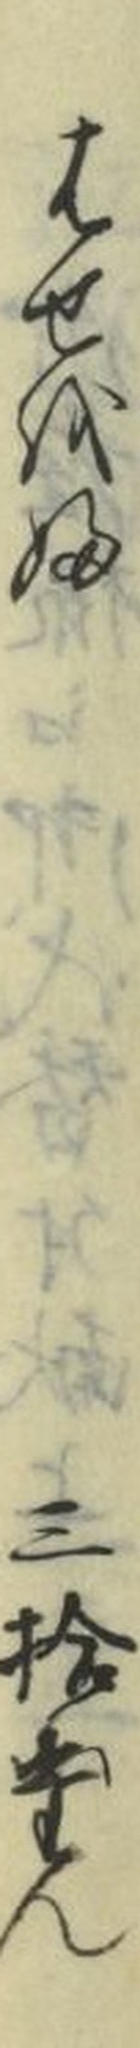はせをふ三拾たん
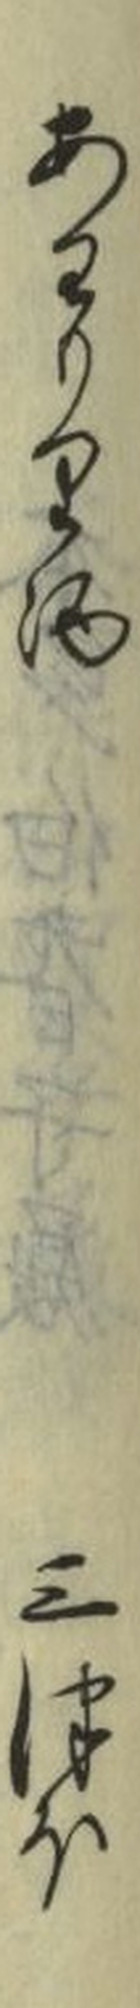あわもり酒三つほ
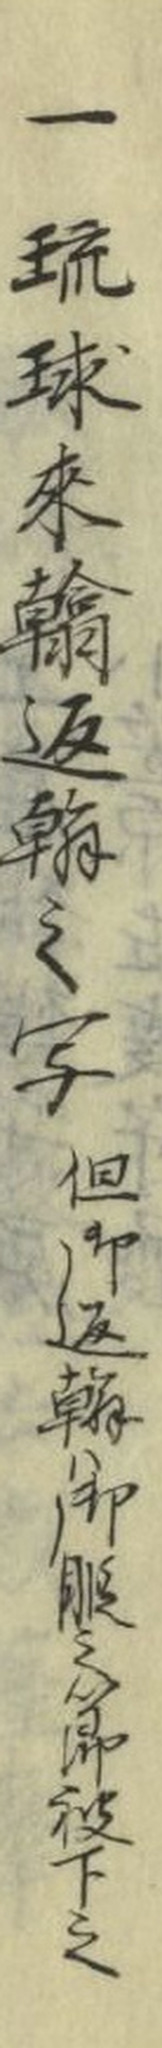一琉球来翰返翰之写但御返翰は御暇之節被下之

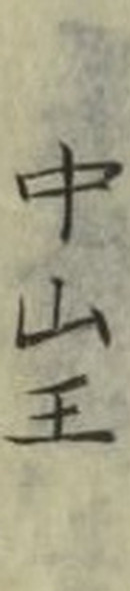中山王
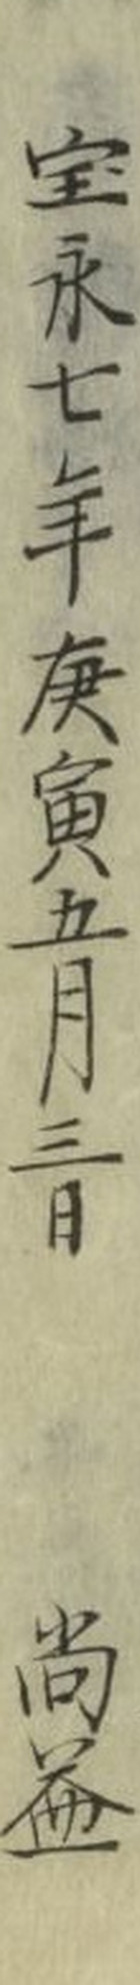宝永七年庚寅五月三日尚益
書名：宝永七庚寅年琉球国来聘使日記
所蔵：University of the Ryukyus Library
